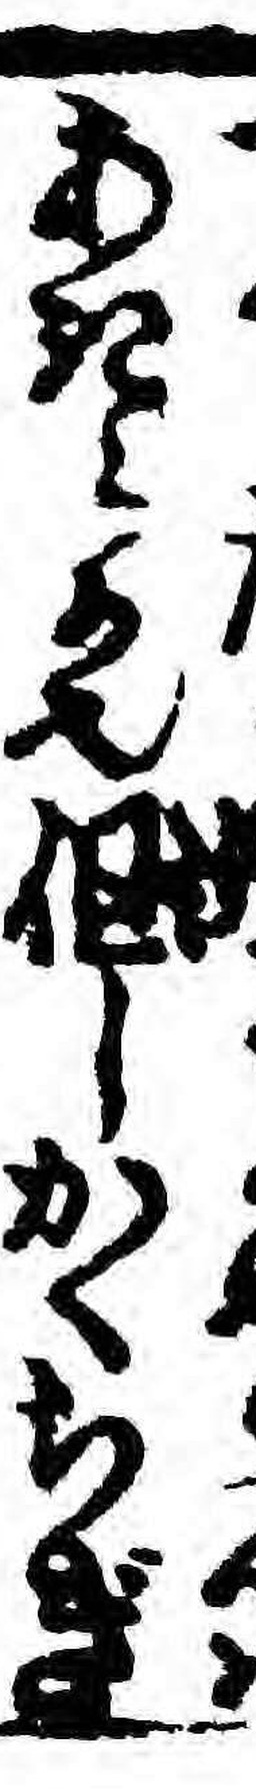あきらか也但しかくちぎ
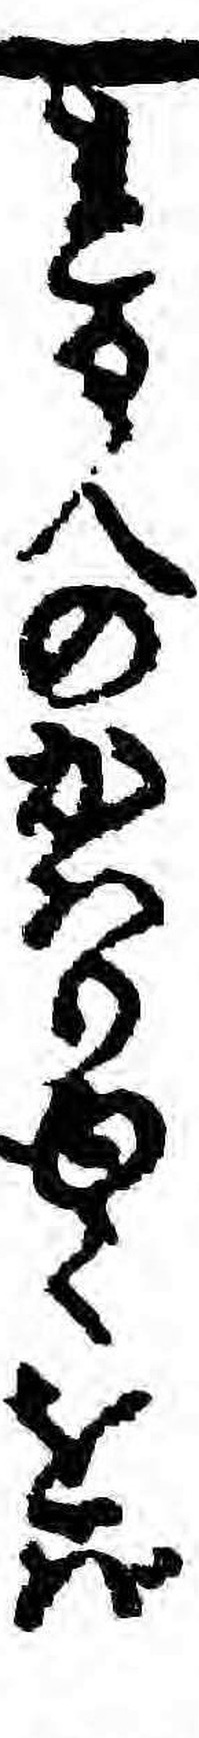れる人のかはりゆくをば
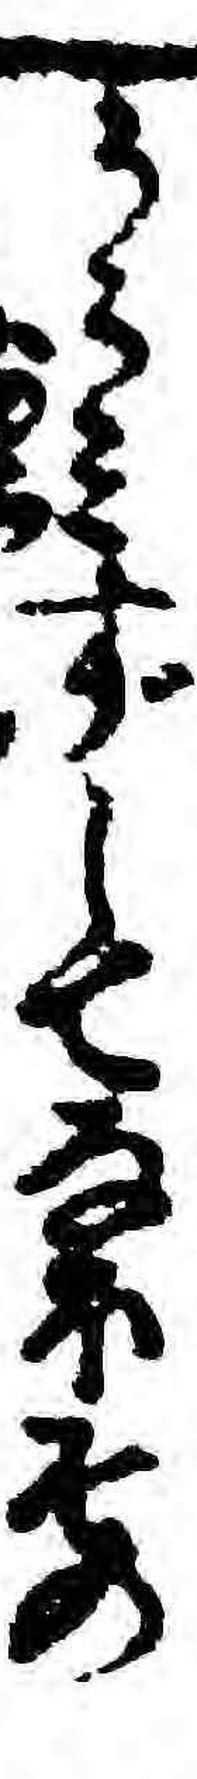うらみずしてなほその
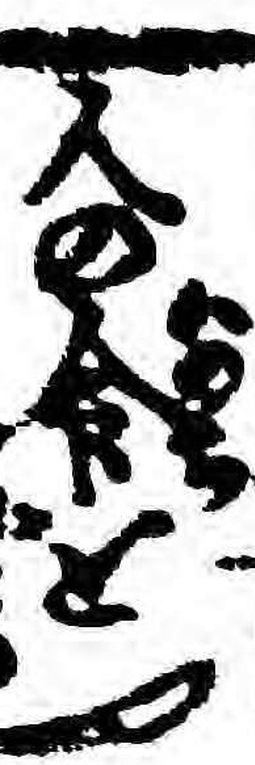人の命を
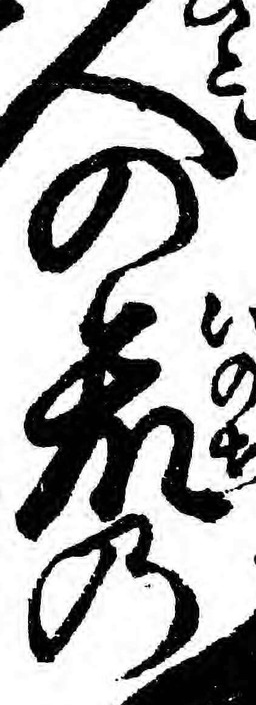人の命の
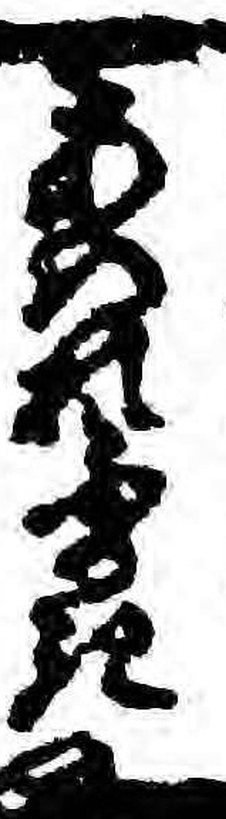あはれふかき
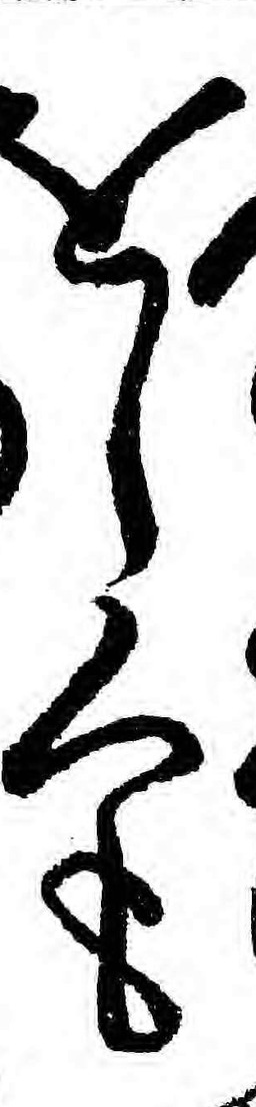をしくも
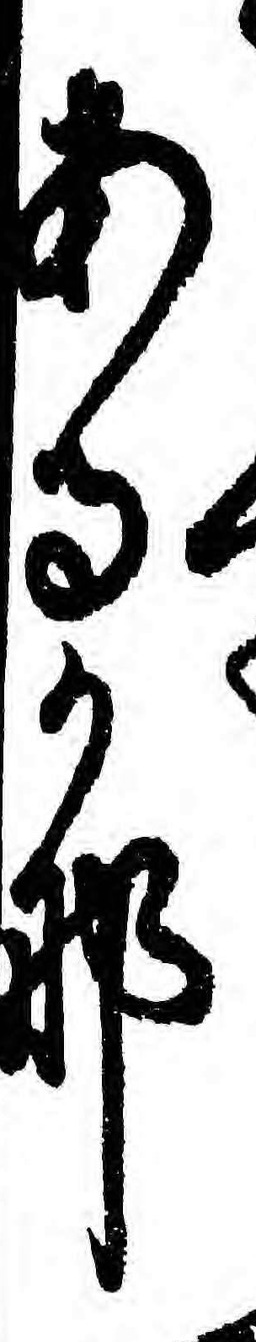あるかな
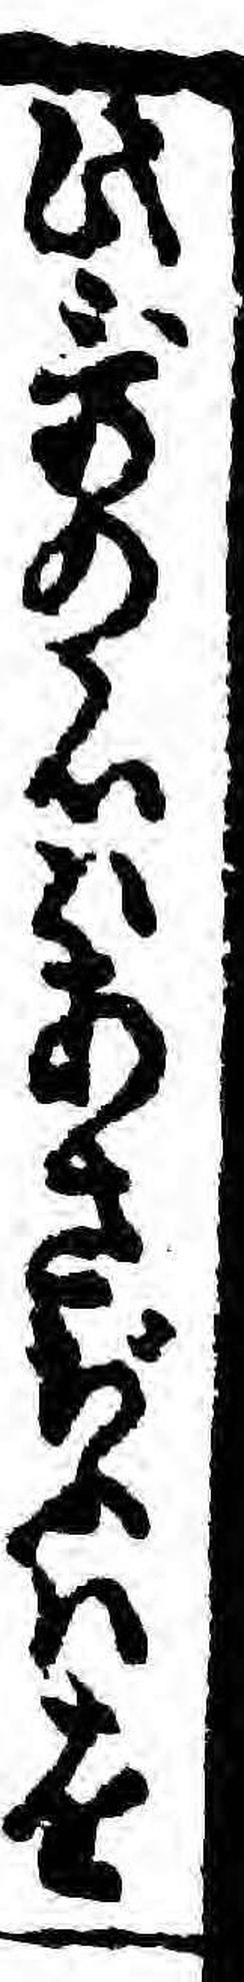此哥の心はあさぢふはを
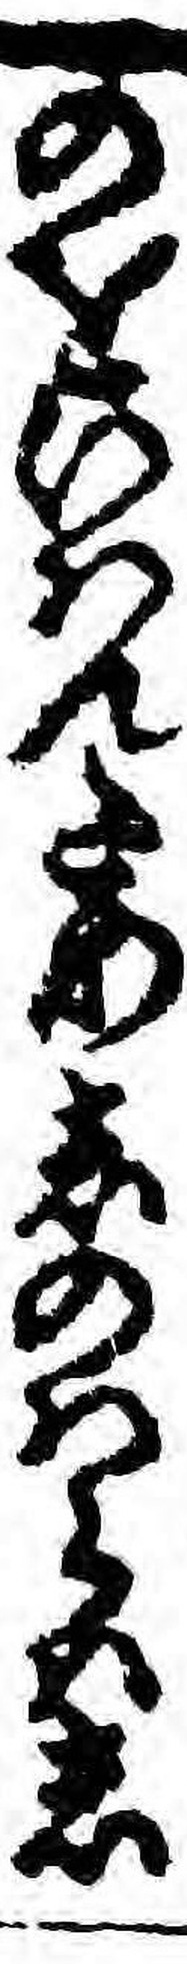のをいはんためしのはらはし
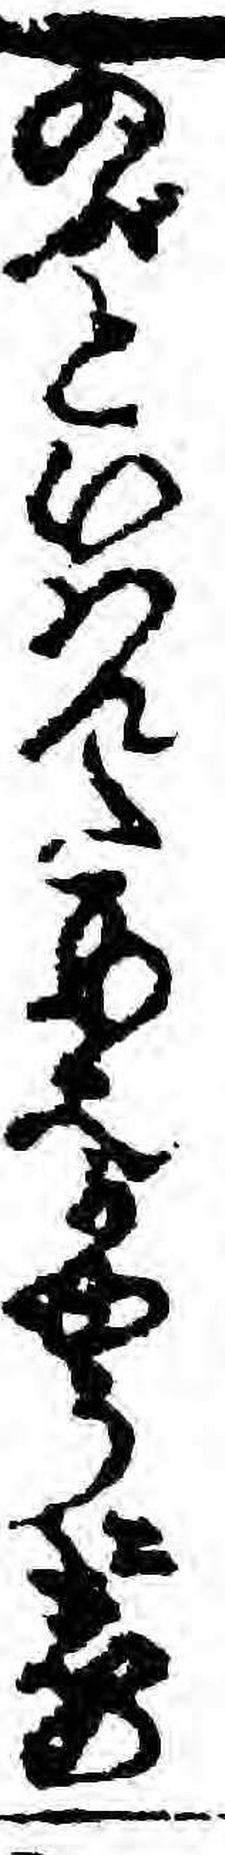のぶといはんため也かやうにしの
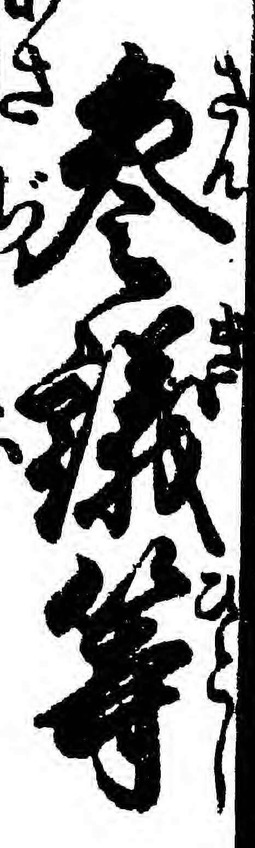参議等
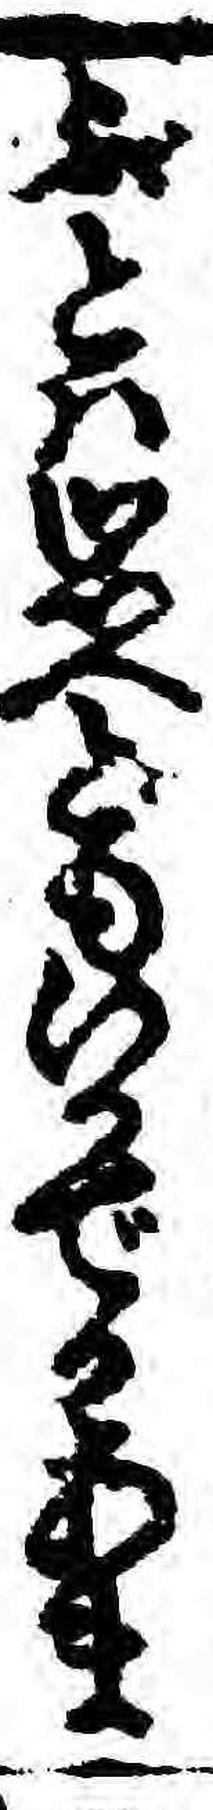ぶとは思へどもいかでかあま
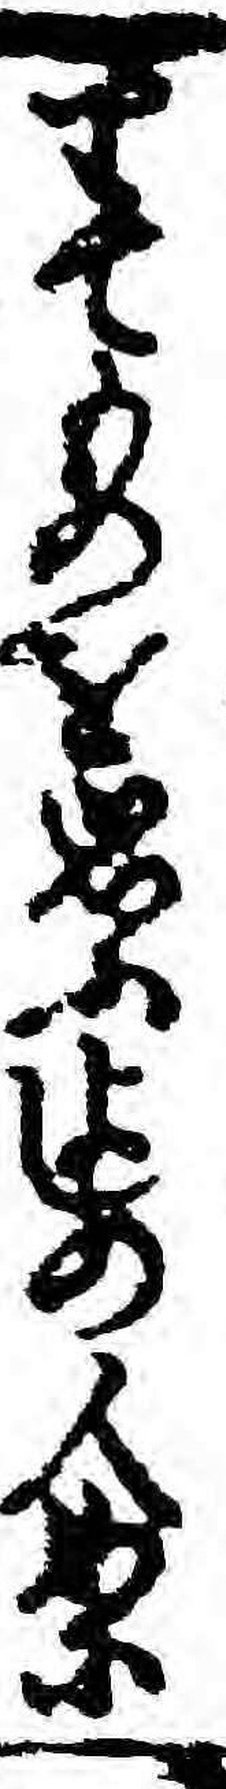りてものを思ふよしの人めに
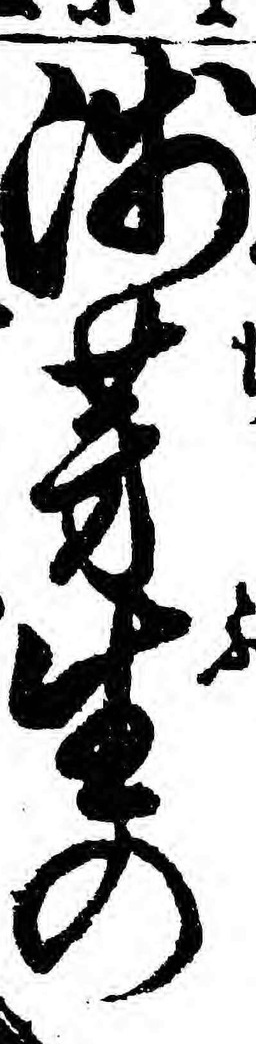浅茅生の
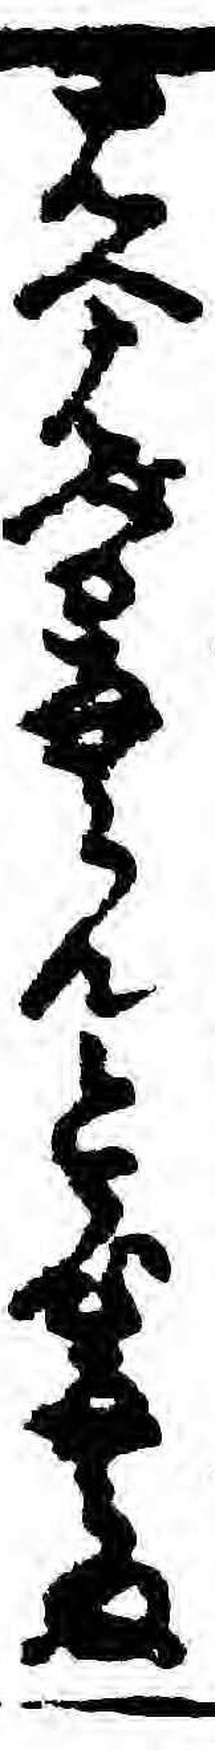見へはべるならんと心ならぬ
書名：頭書和歌注譯／壽賀多百人一首小倉錦
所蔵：国文学研究資料館
